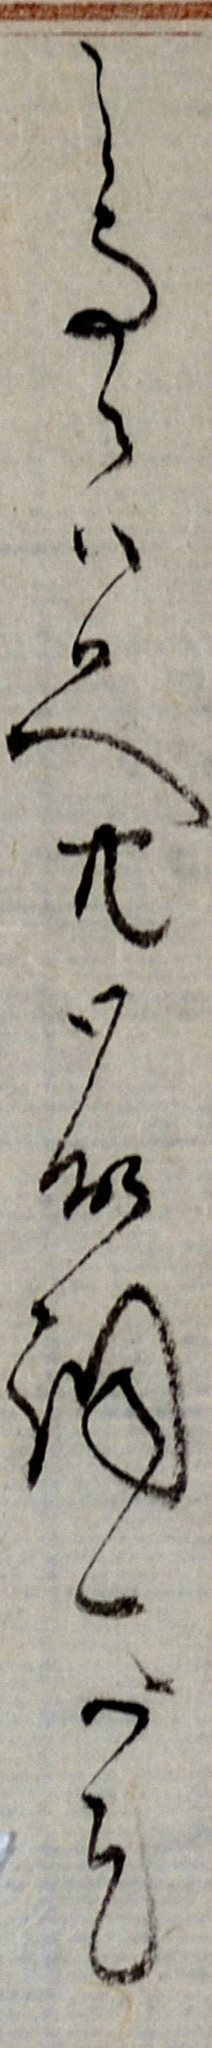之事には候へ共御取調可被下候
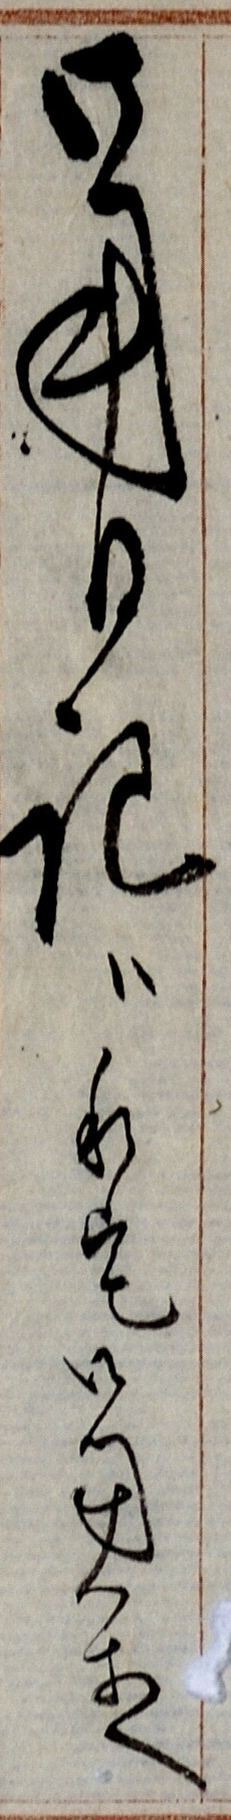御用日記は私宅御用箱へ
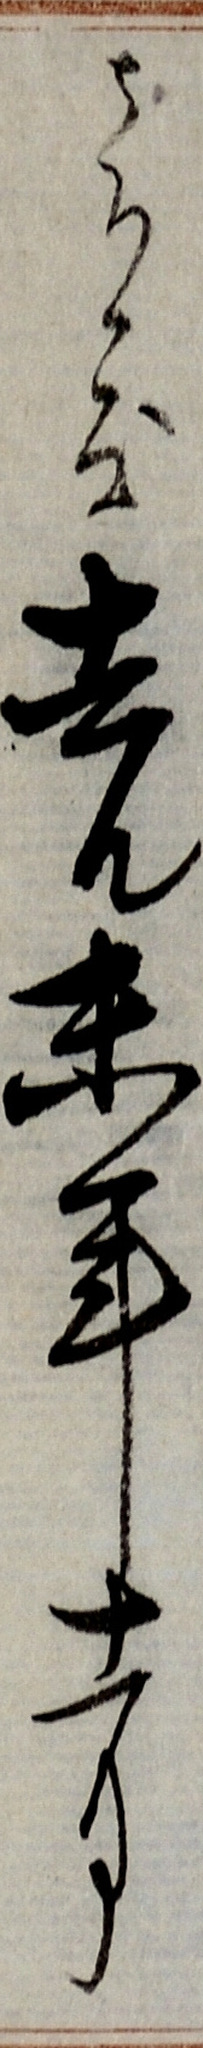被下度去ル未年十一月
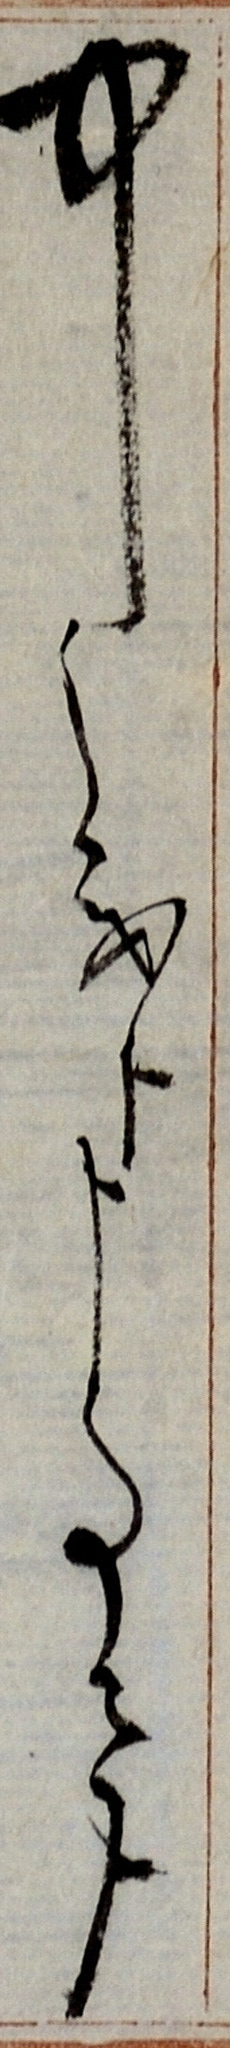中之義ト申事に候
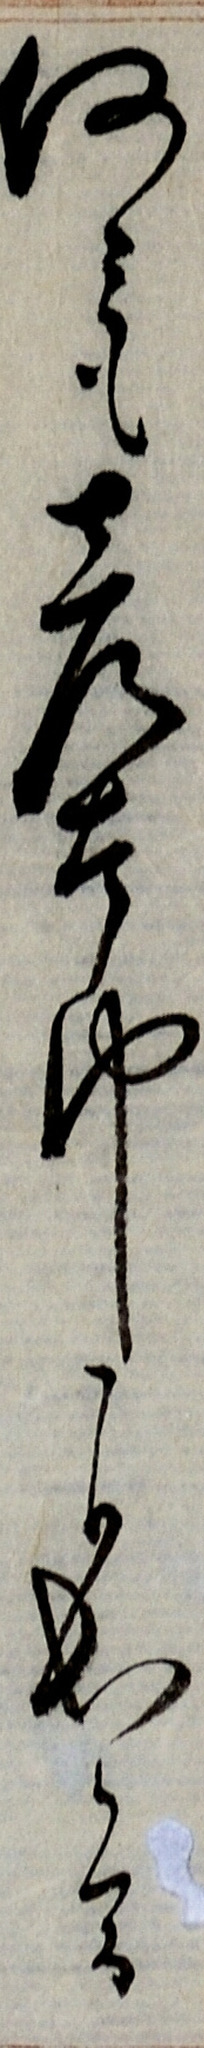何にも彦太郎召出候間
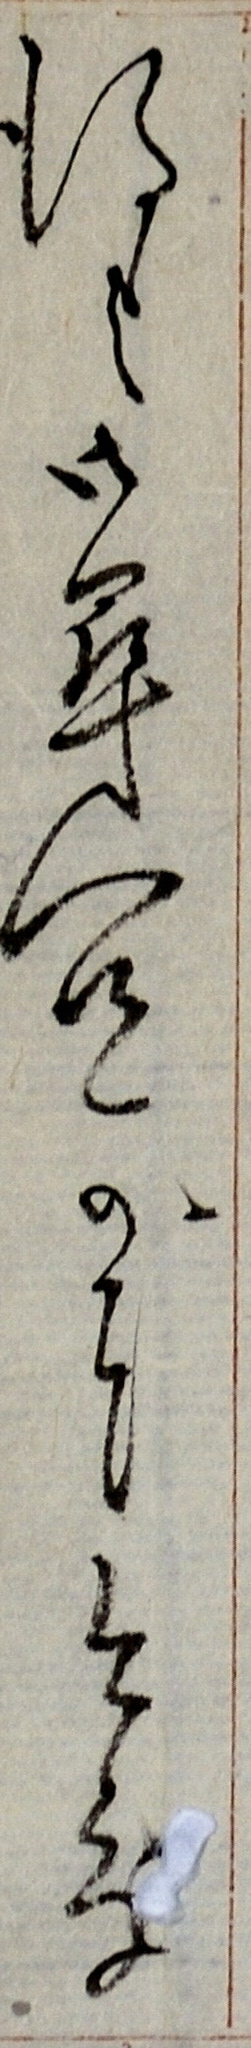得と御尋問可被下候今度
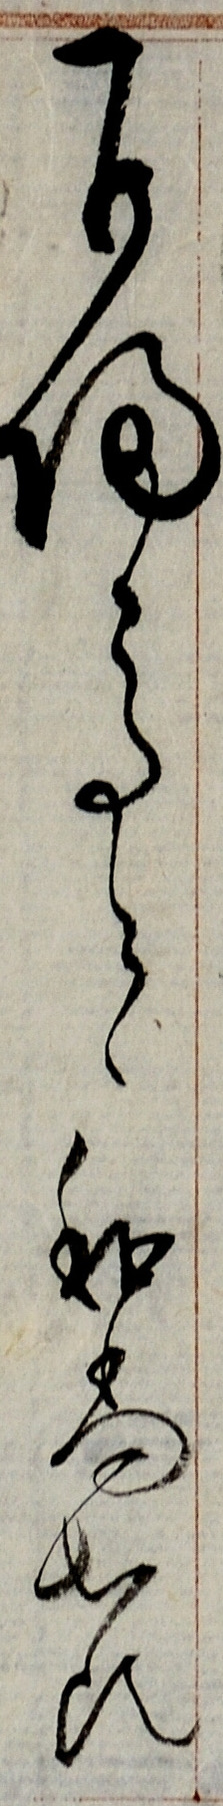召帰候事に候和尚出頭
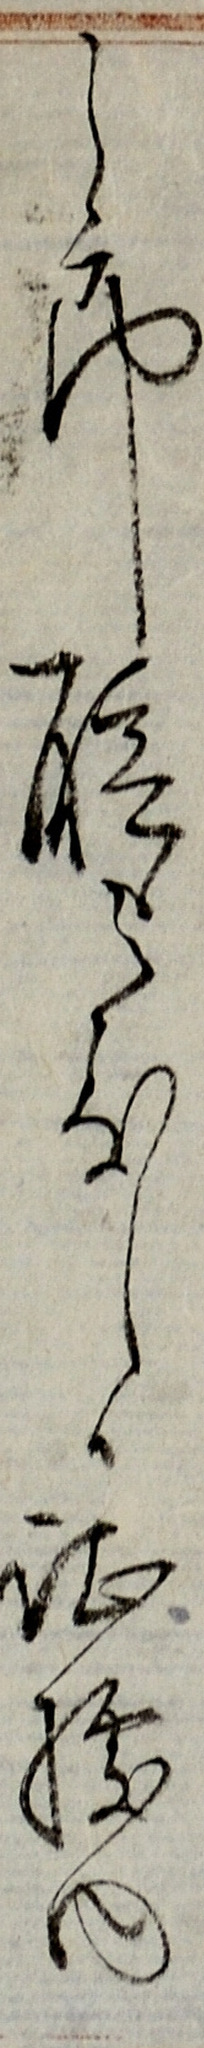之節聢と致し候証拠物
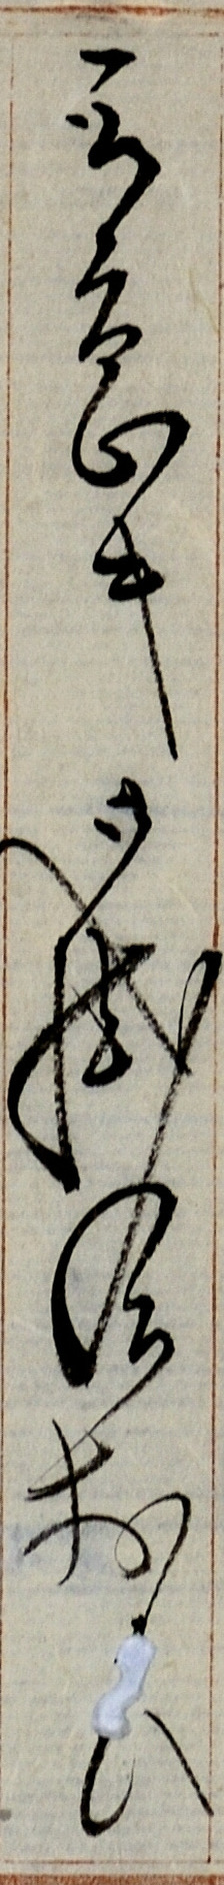取急キ御掛合およひ
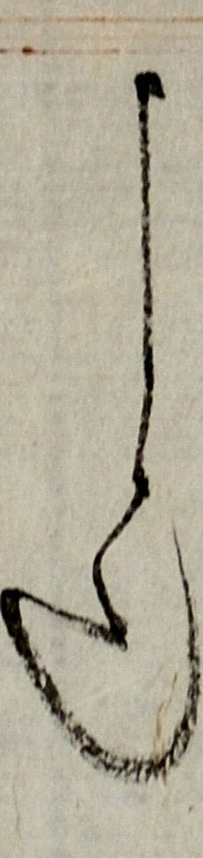申候也
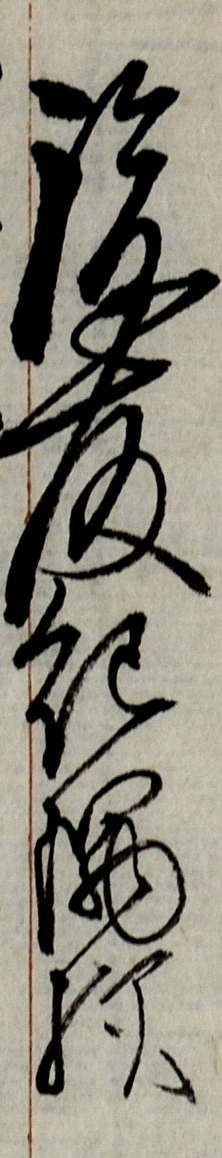後藤紀隅様
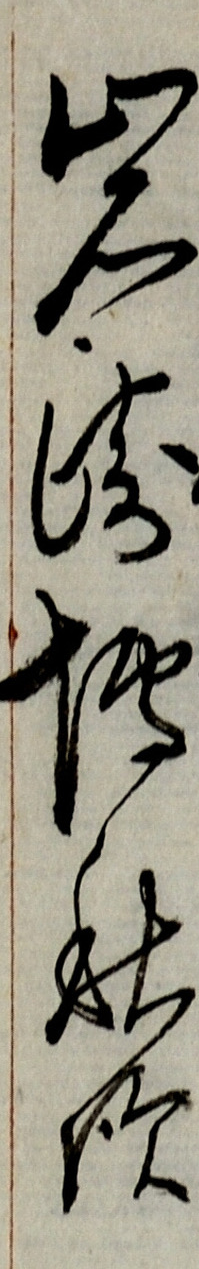岩崎博秋様
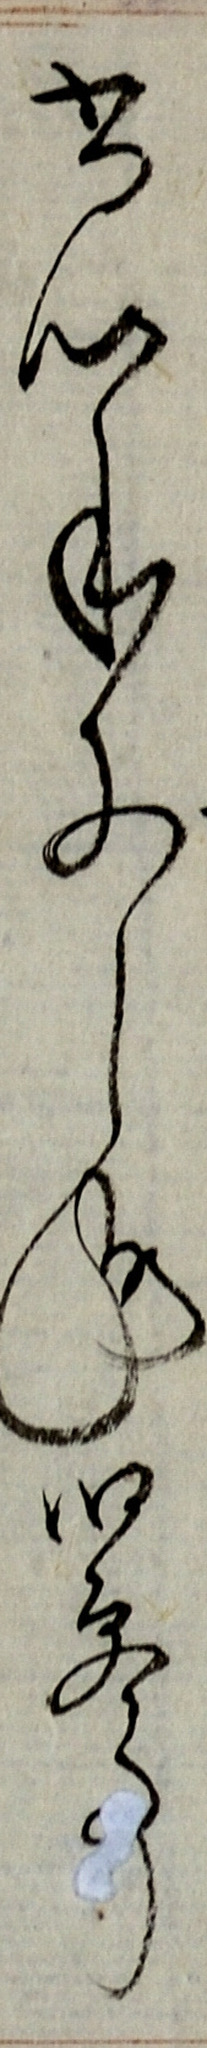尚以本文之趣旧参事
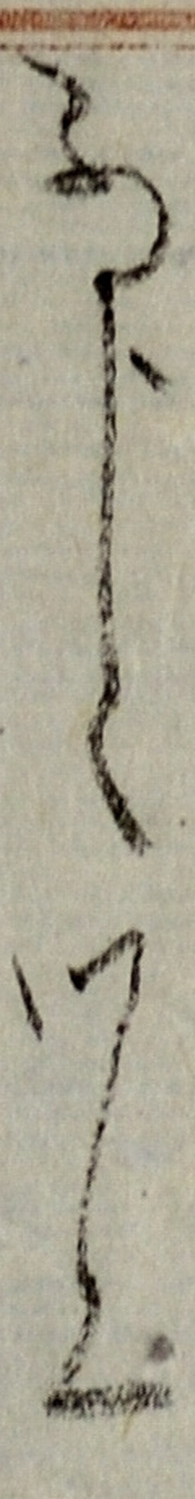不申候以上
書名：書状
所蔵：伊那市立高遠町図書館・合同会社AMANE
